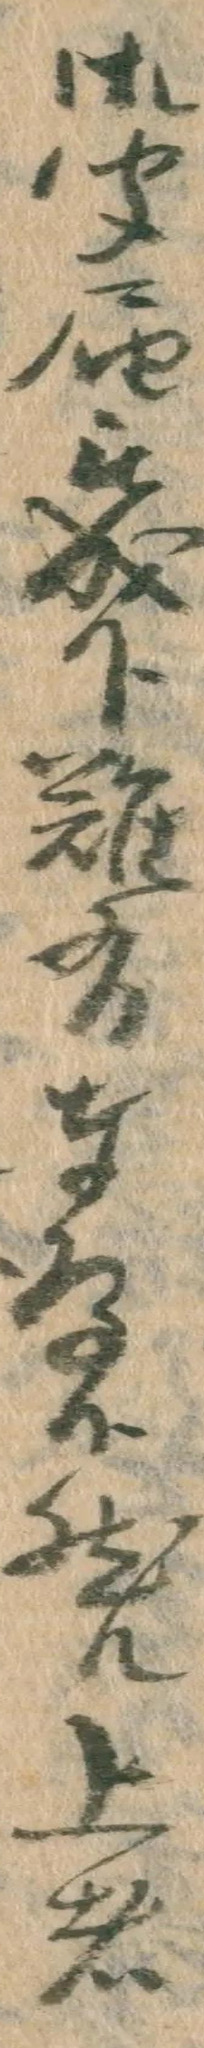御聞届被成候難有奉存候然ル上者
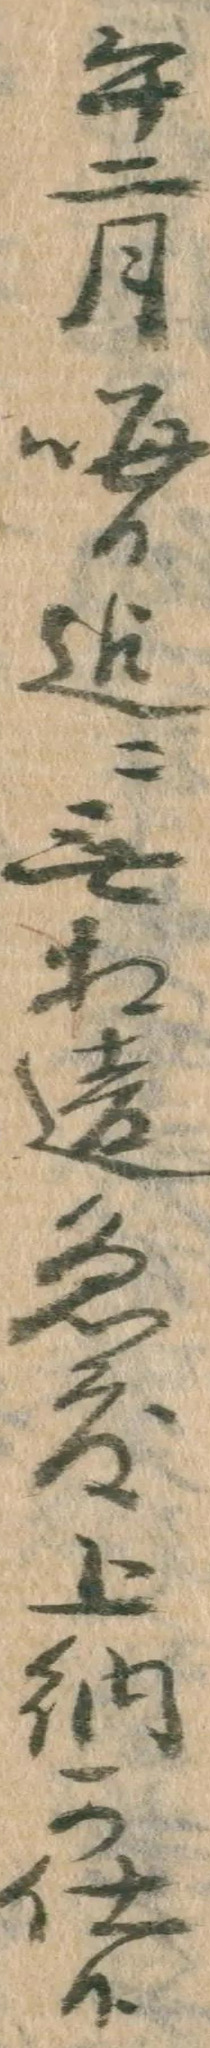午二月晦日迄二無相違急度上納可仕候
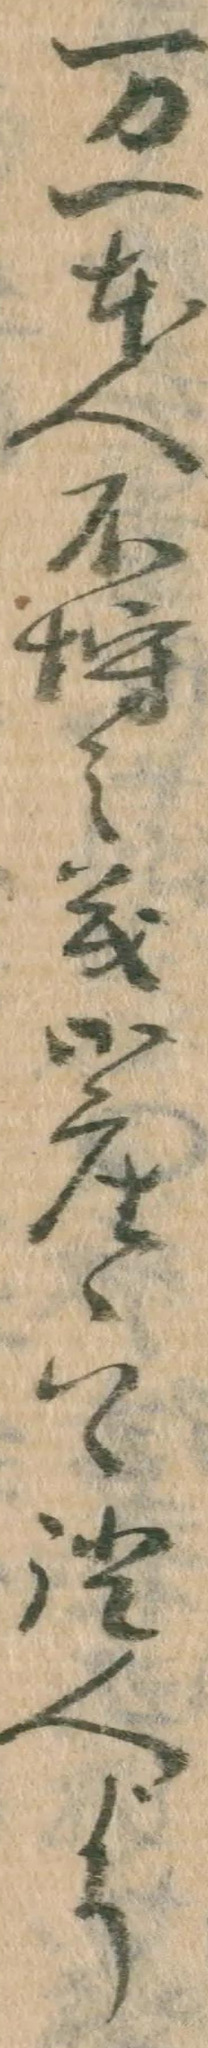万一本人不埒之義御座候ハヽ証人より
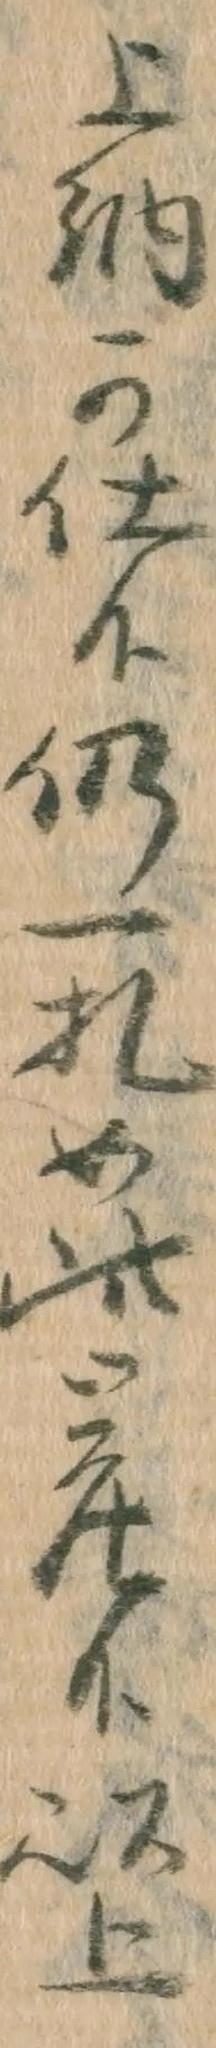上納可仕候仍一札如此御座候以上
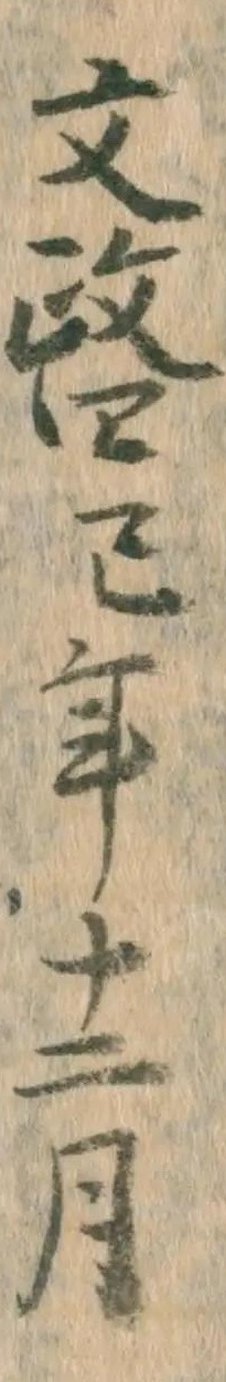文政四巳年十二月
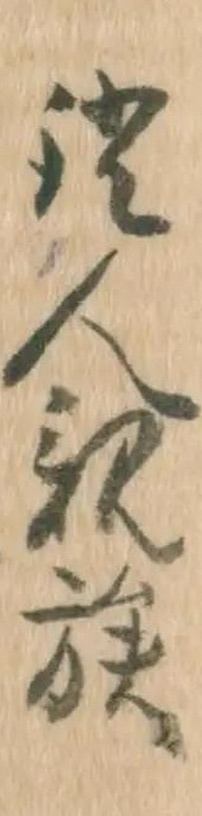證人親族
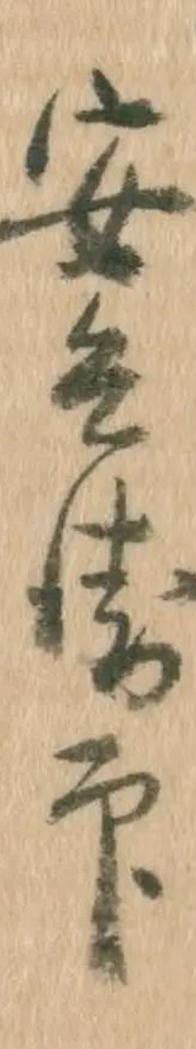安兵衛印
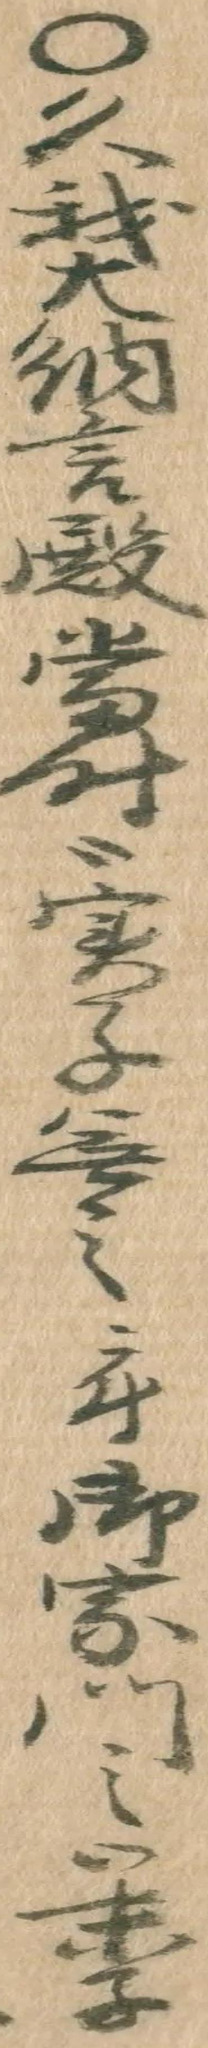○久我大納言殿當時御実子無之ニ付御家門之御末子
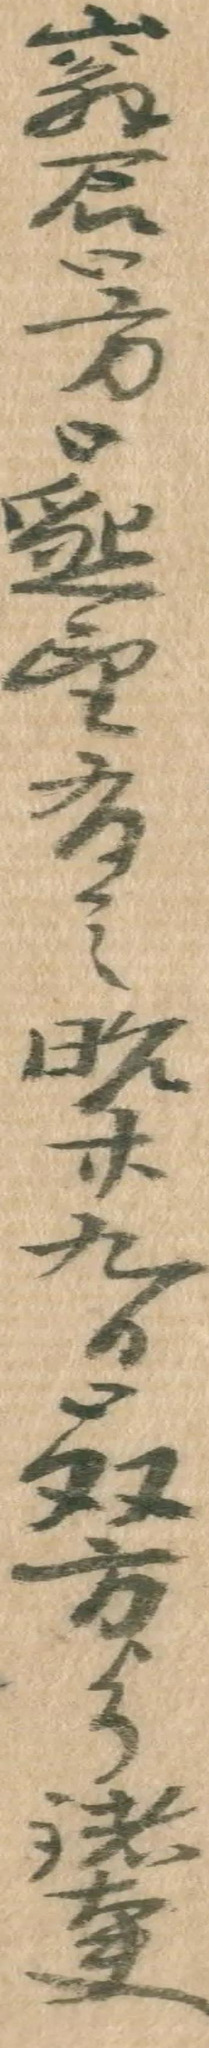窮君御方御懇望有之昨廿九日御双方より諸大夫
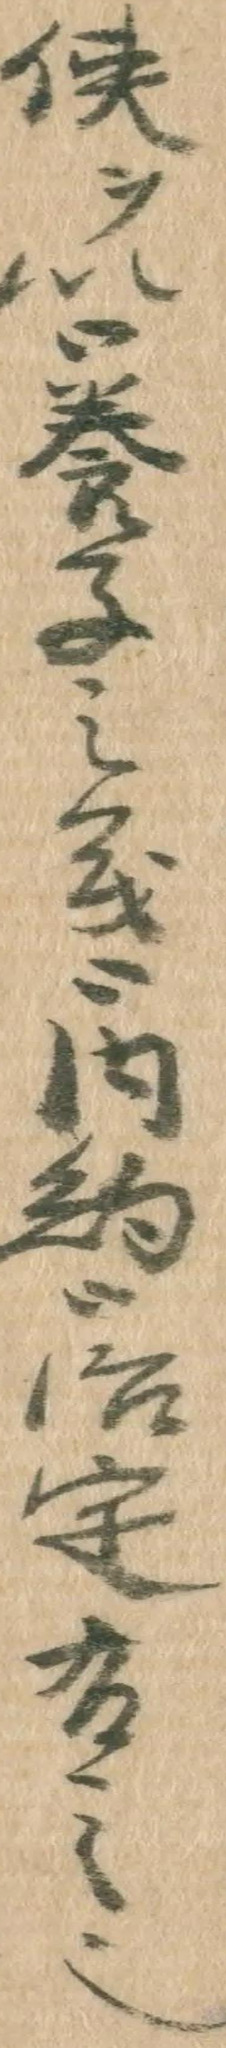使ヲ以御養子之義御内約御治定有之也
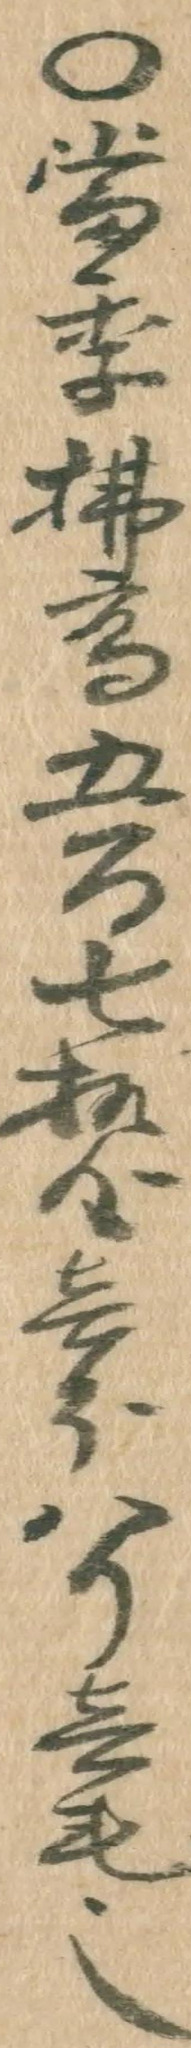○當季払高五百七拾匁壱分八夕壱毛也

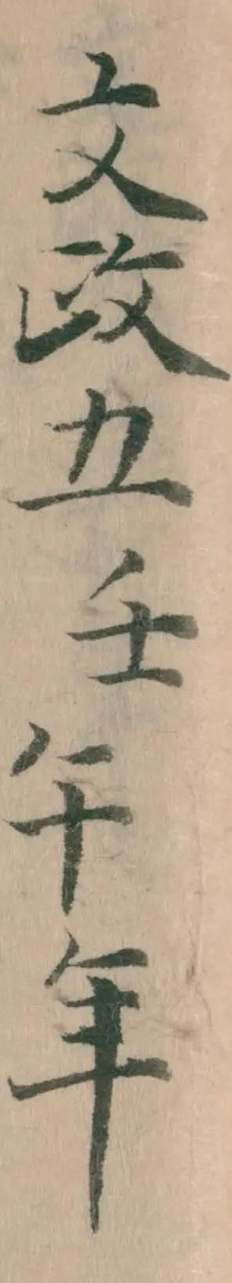文政五壬午年
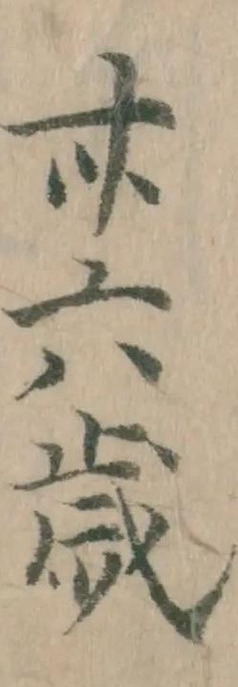卅六歳
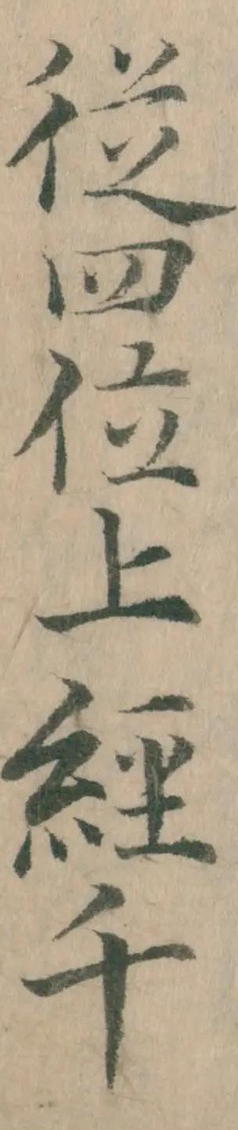従四位上經千

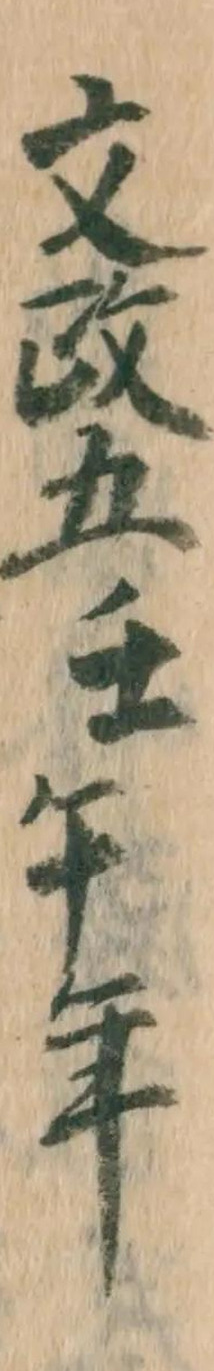文政五壬午年
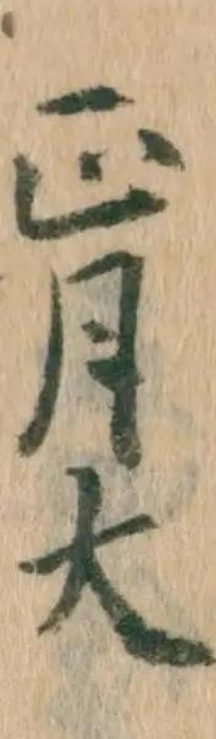正月大
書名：賀茂社記録. 第63冊
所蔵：国立国会図書館 National Diet Library, JAPAN
